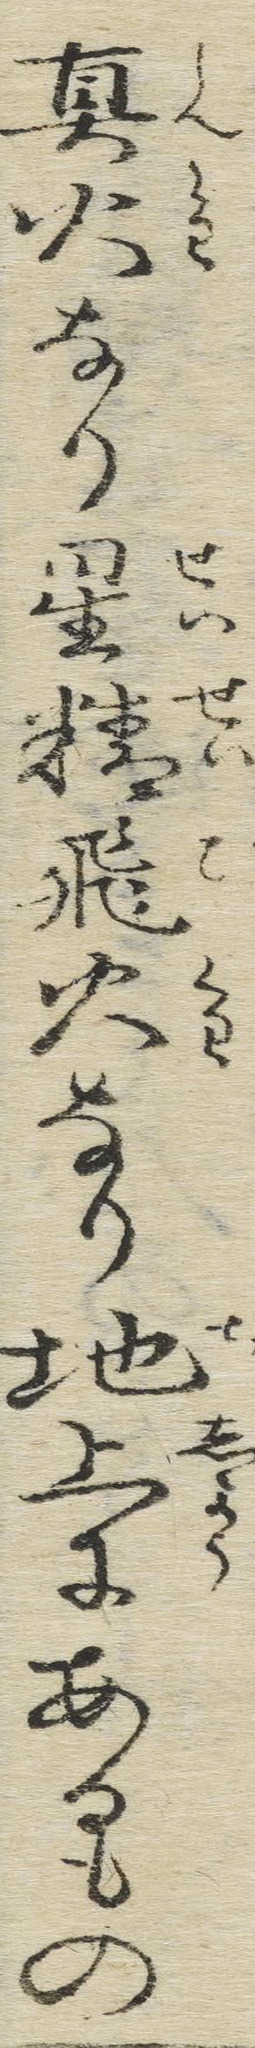真火なり星精飛火なり地上にあるもの
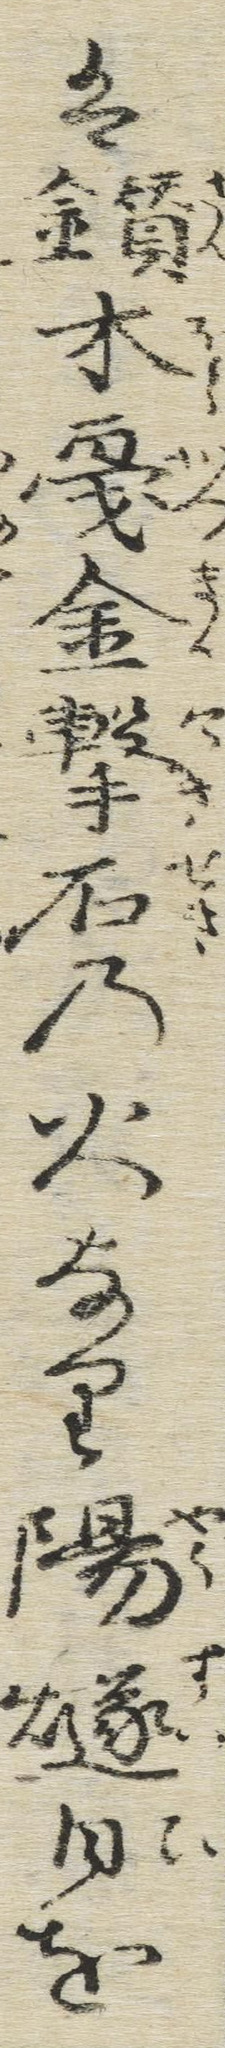は鑚木戞金撃石の火なり陽燧日を
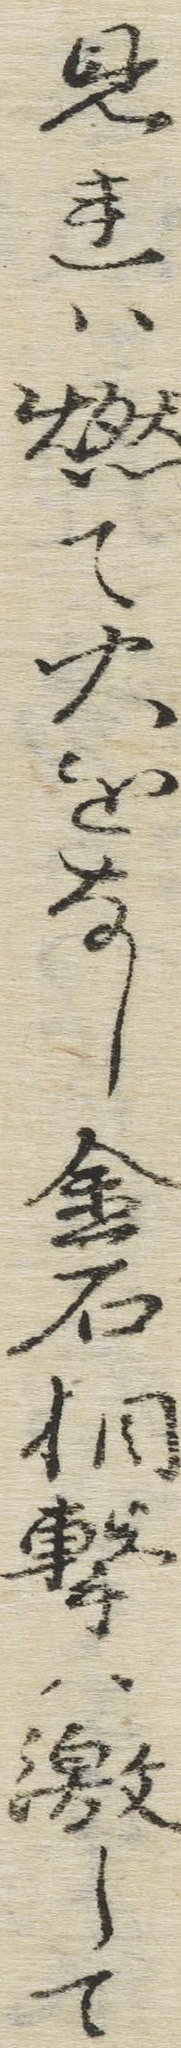見れは燃て火をなし金石相撃は激して
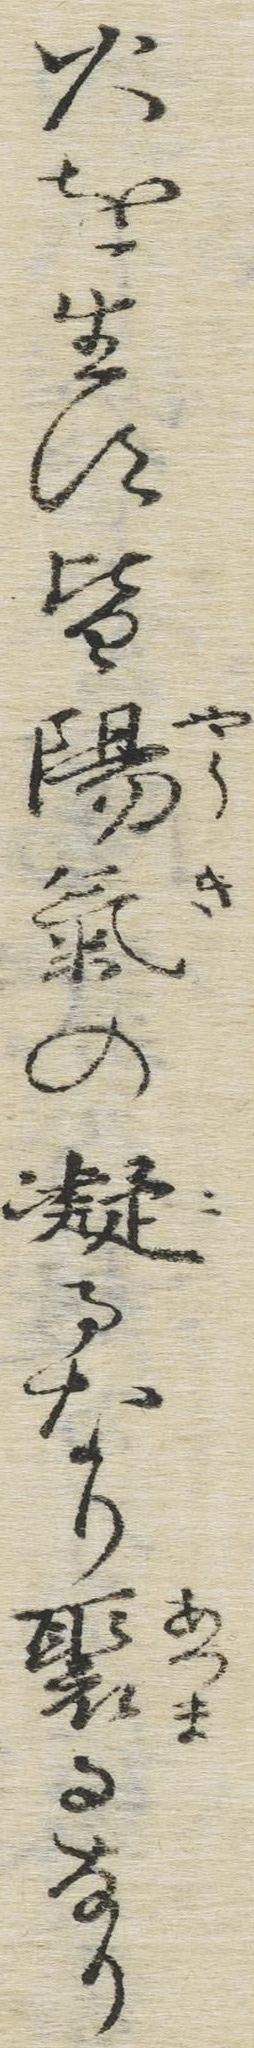火を生す皆陽気の凝るなり聚るなり
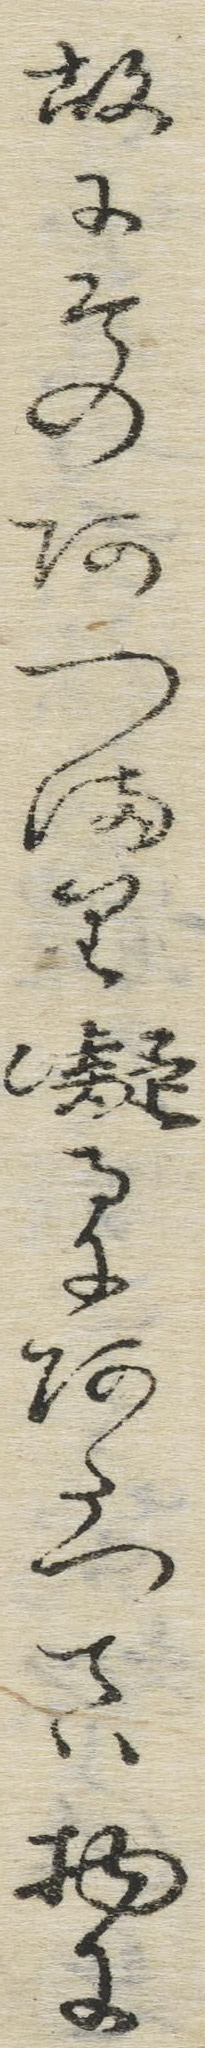故にそのあつまり凝るにあたつては物に
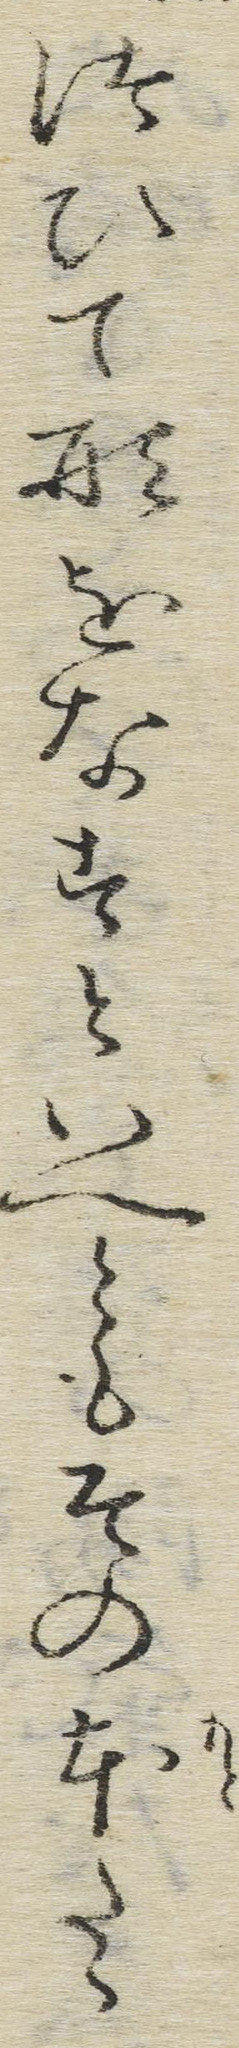つひて形をなすといへともその本たゝ
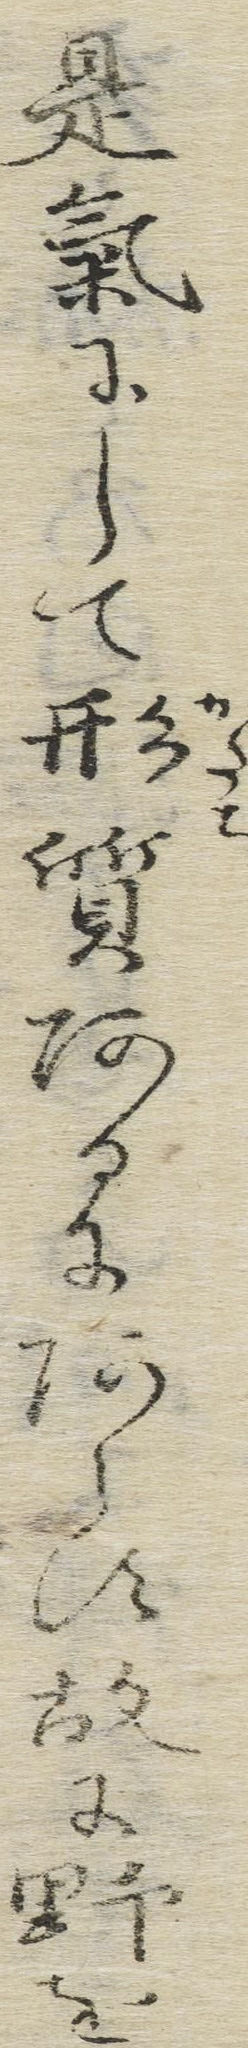是気にして形質あるにあらす故に野を
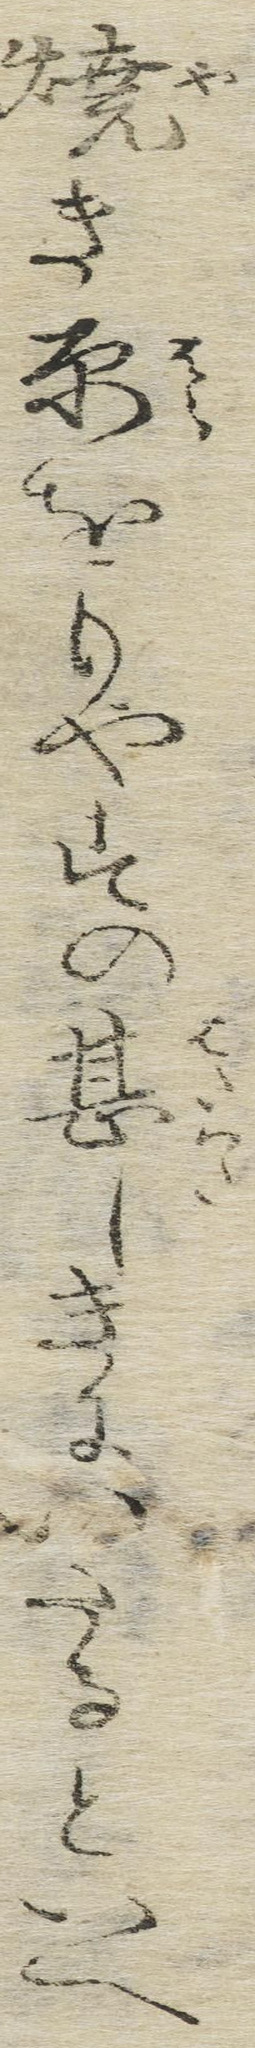焼き原をもやすの甚しきにいたるといへ
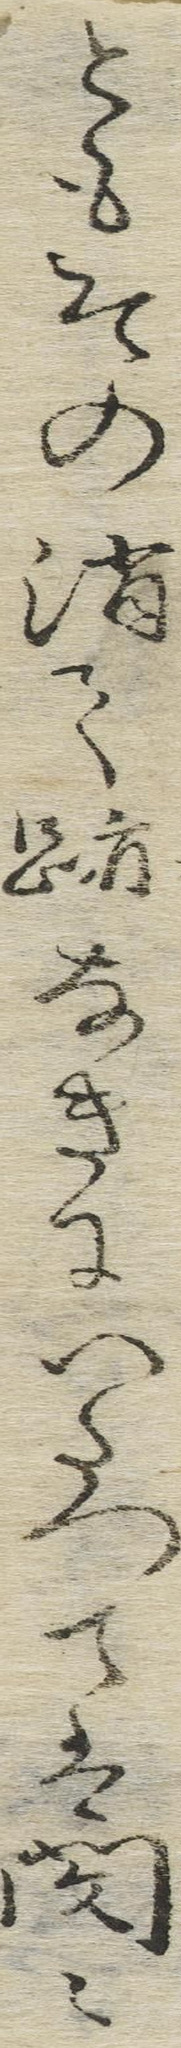ともその消て跡なきにいたつては閔々

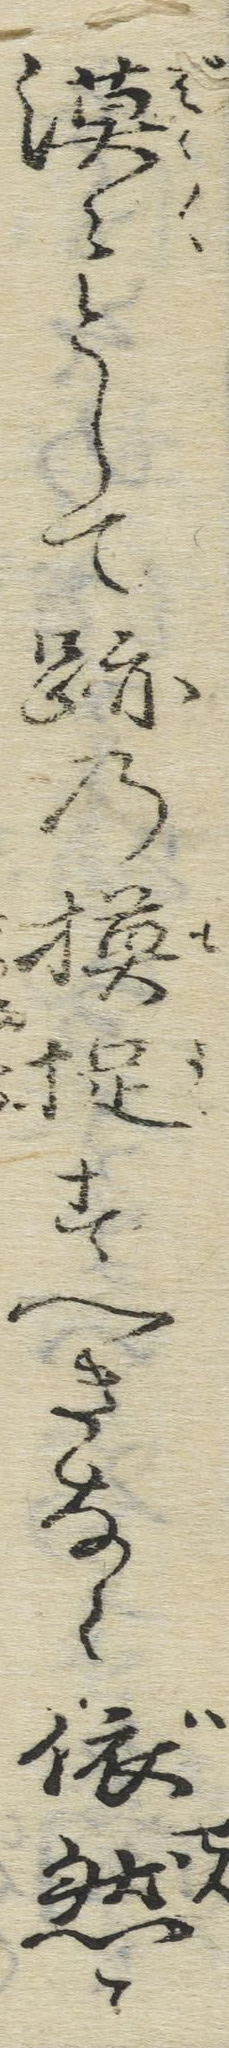漠ゝとして跡の摸捉すへきなく依然と
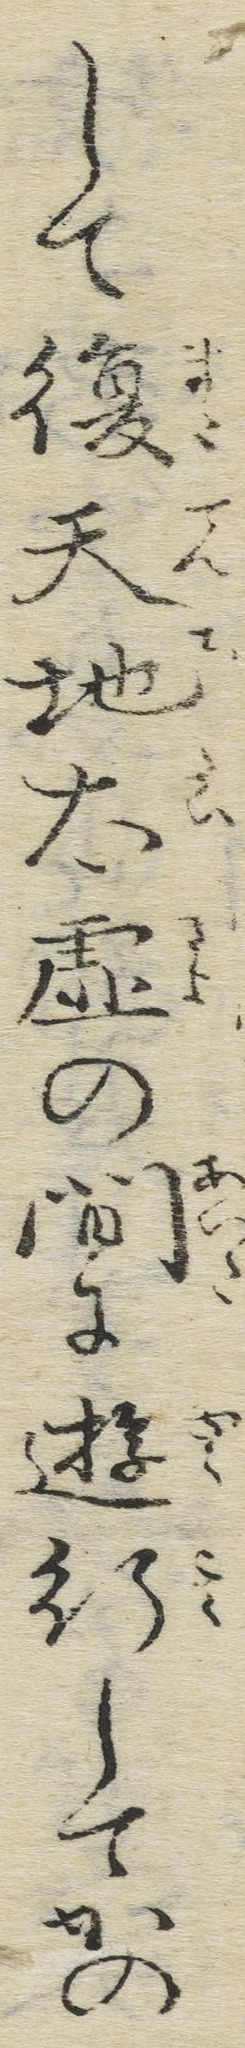して復天地太虚の間に遊行してかの
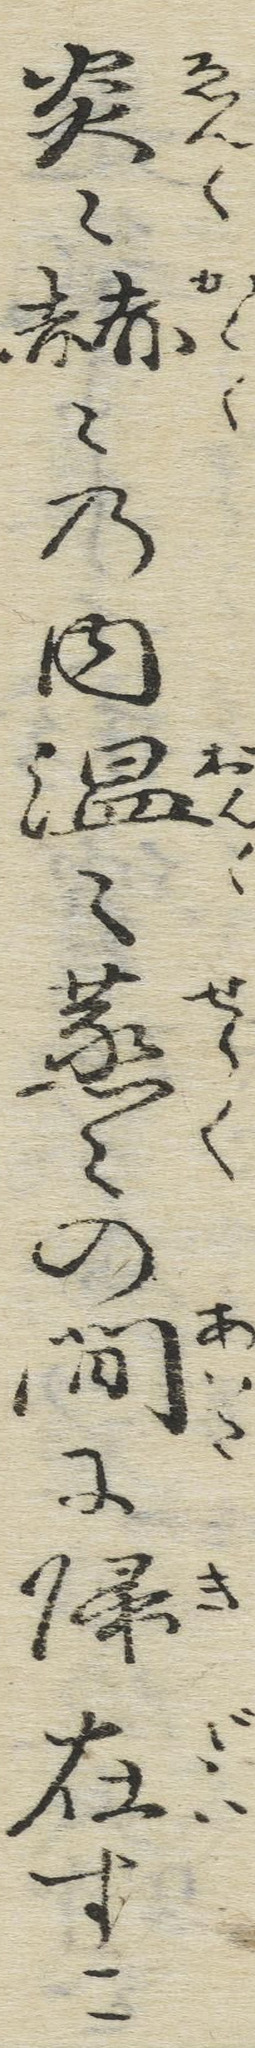炎ゝ赫ゝの内温ゝ蒸ゝの間に帰在すこ
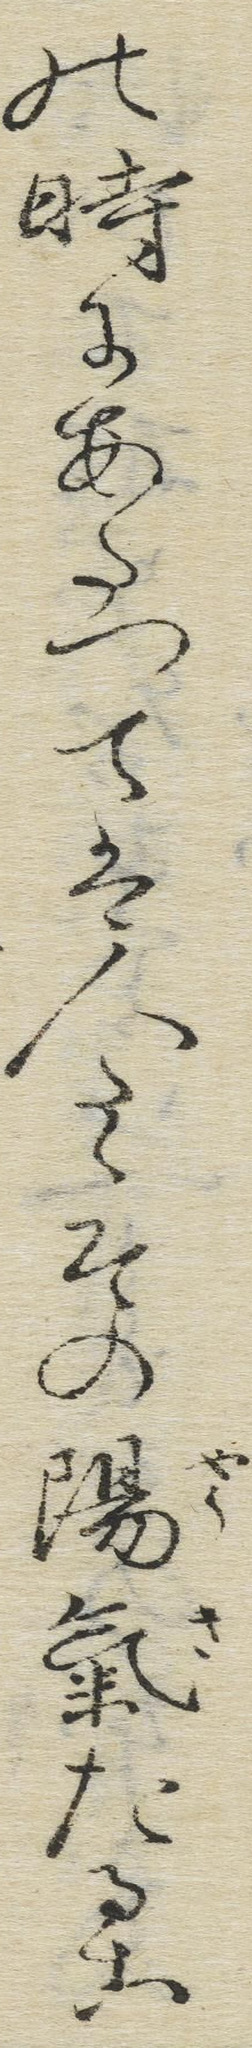の時にあたつては人はたゝその陽気たるこ
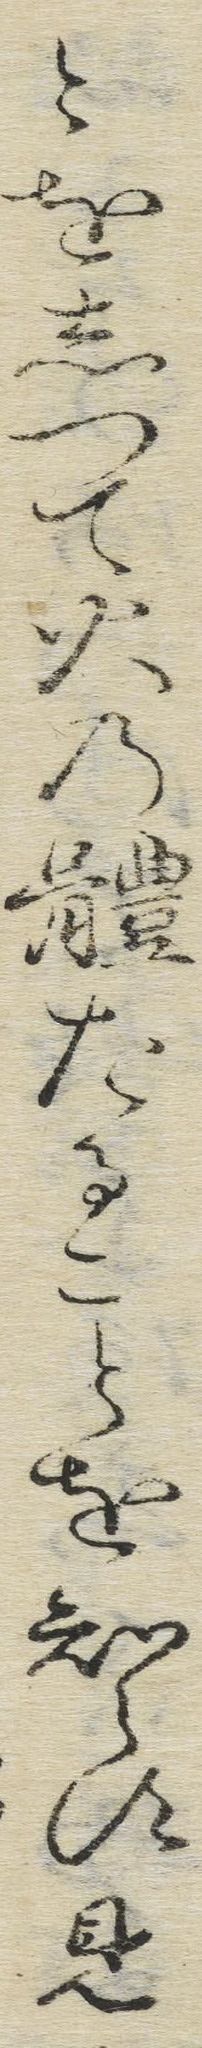とをしつて火の体たることを知らす見
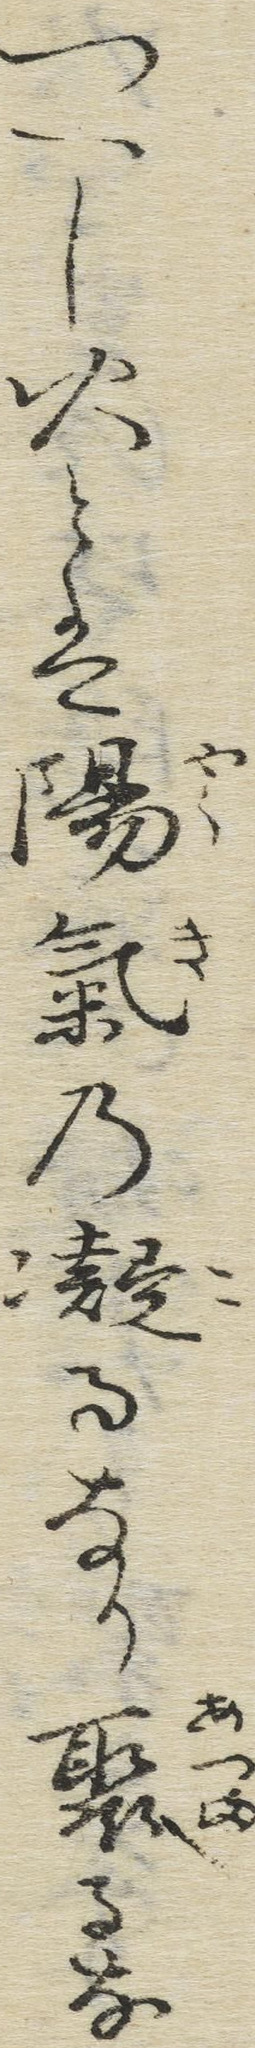ついし火とは陽気の凝るなり聚るな
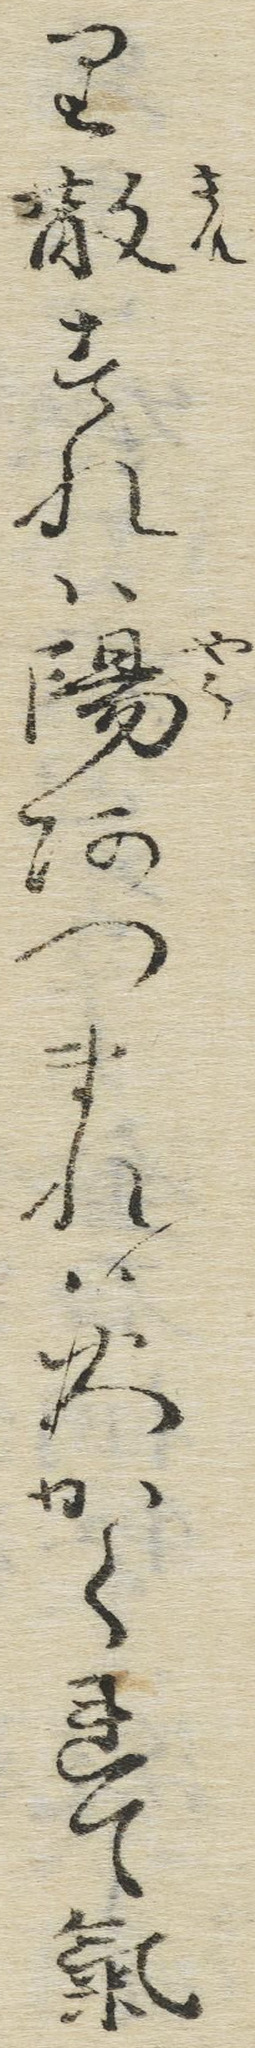り散すれは陽あつまれは火かくれて気
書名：温泉考
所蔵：東京大学地震研究所図書室 Earthquake Research Institute Library, The University of Tokyo, JAPAN
